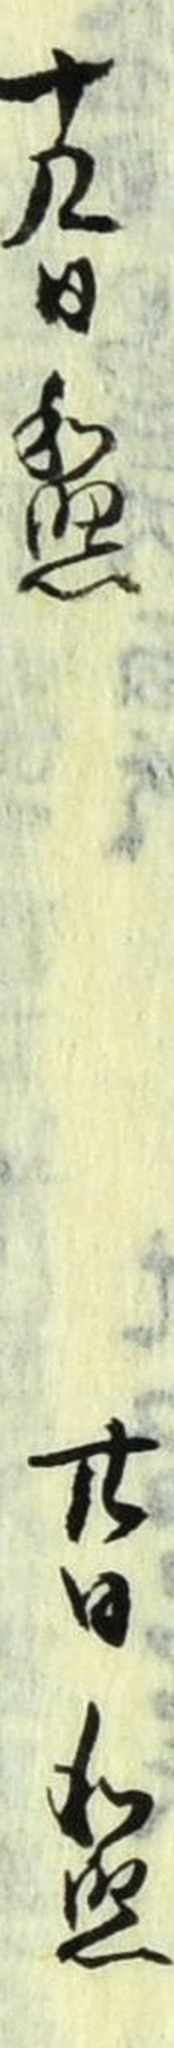十九日和照廿日和照
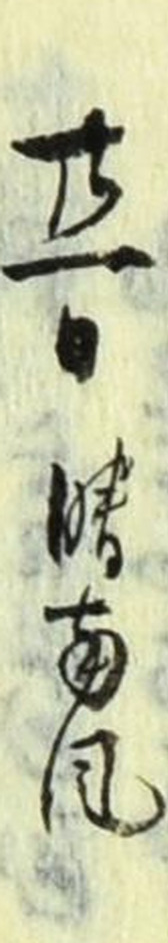廿一日晴南風
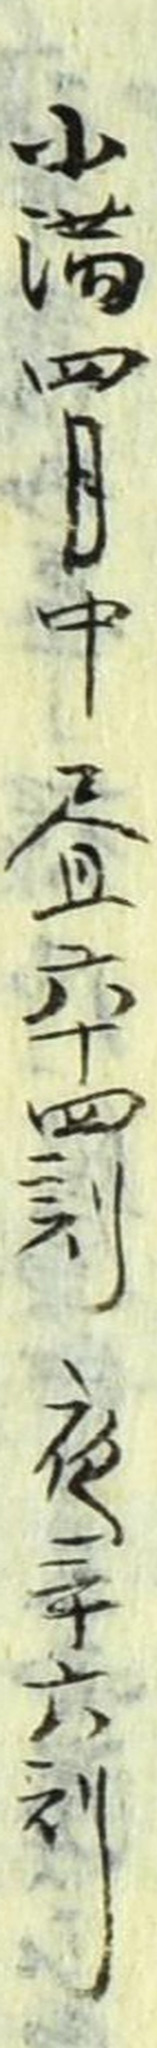小満四月中昼六十四刻夜三十六刻
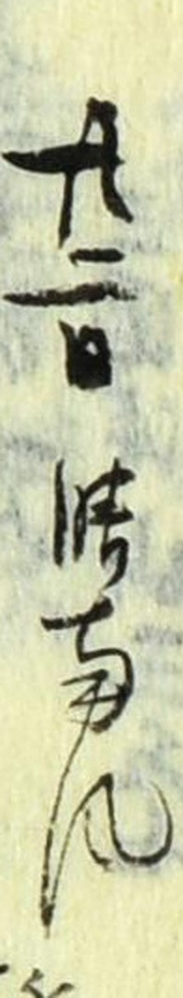廿一日晴南風
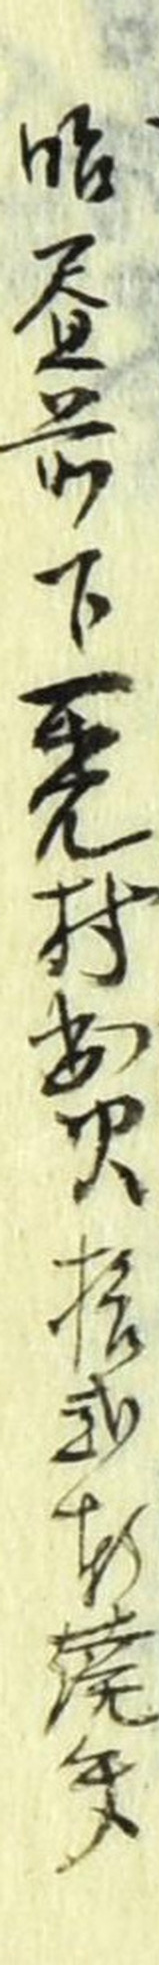昨昼前下一光村出火拾弐軒焼失

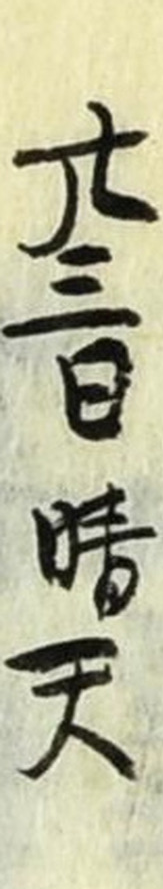廿三日晴天
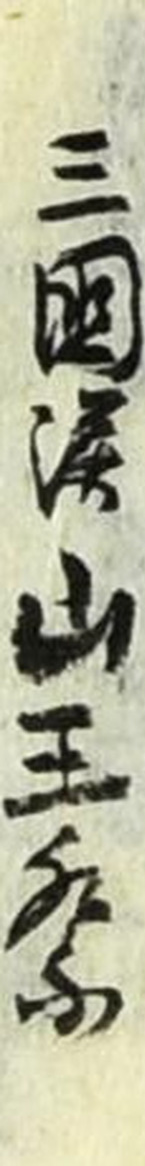三国湊山王祭
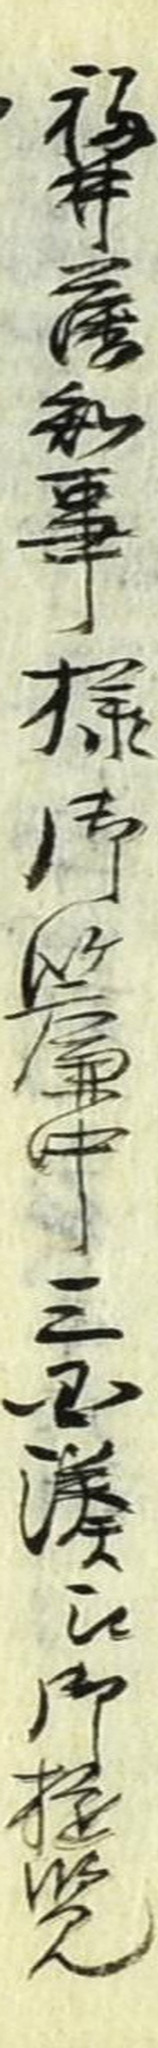福井藩知事様御簾中三国湊江御遊覧
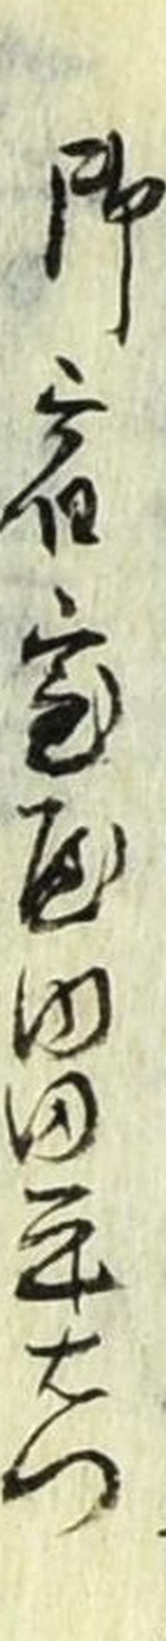御宿室屋内田平右衛門
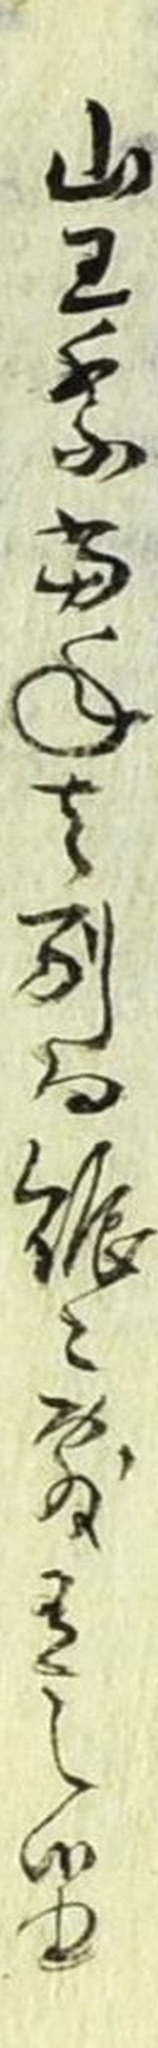山王祭当年者別而賑々敷有之候由
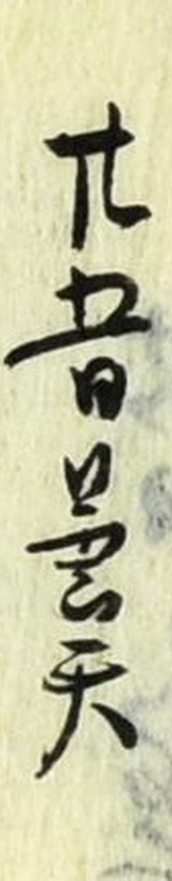廿三日晴天
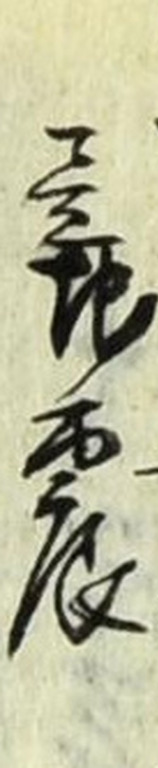昼地震
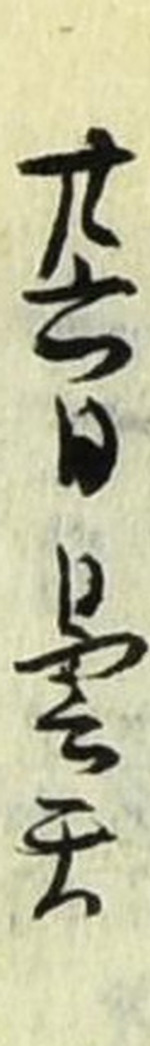廿三日晴天
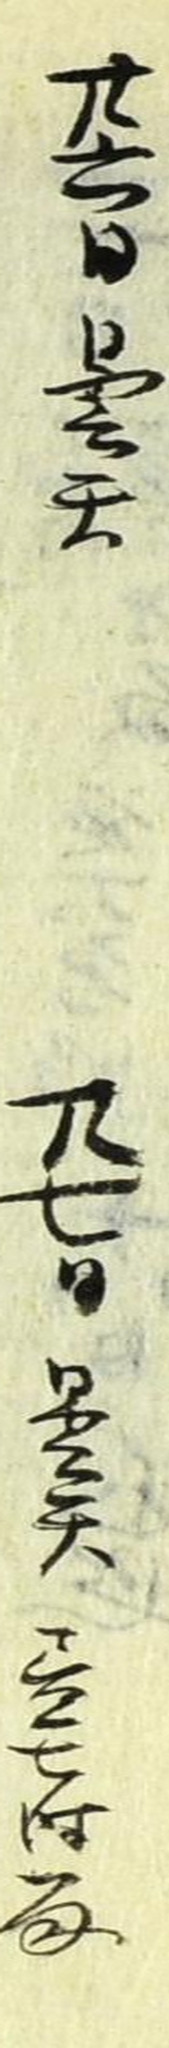廿六日曇天廿七日曇天昼七時雨
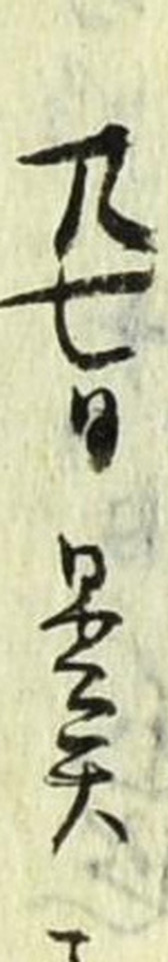廿三日晴天
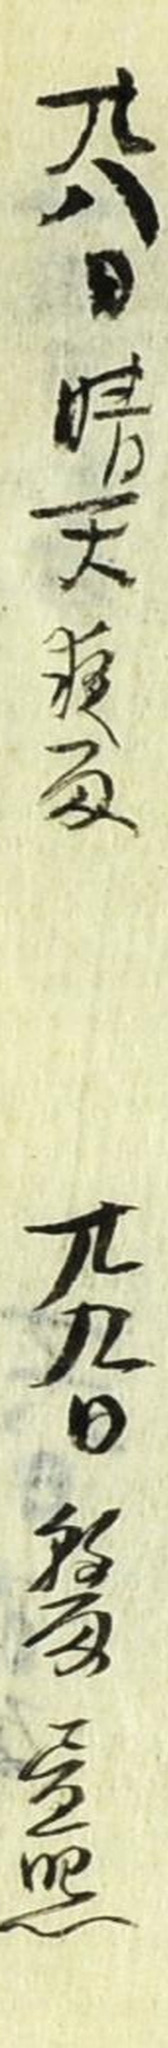廿八日晴天夜雨廿九日朝雨昼照
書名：（日記）
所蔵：福井県文書館 Fukui Prefectural Archives
